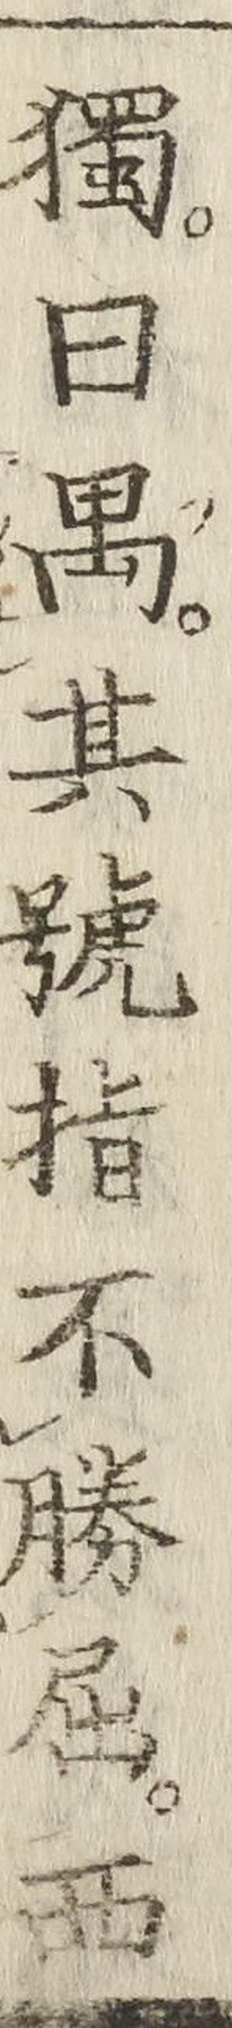独。曰禺。其号指不勝屈。西
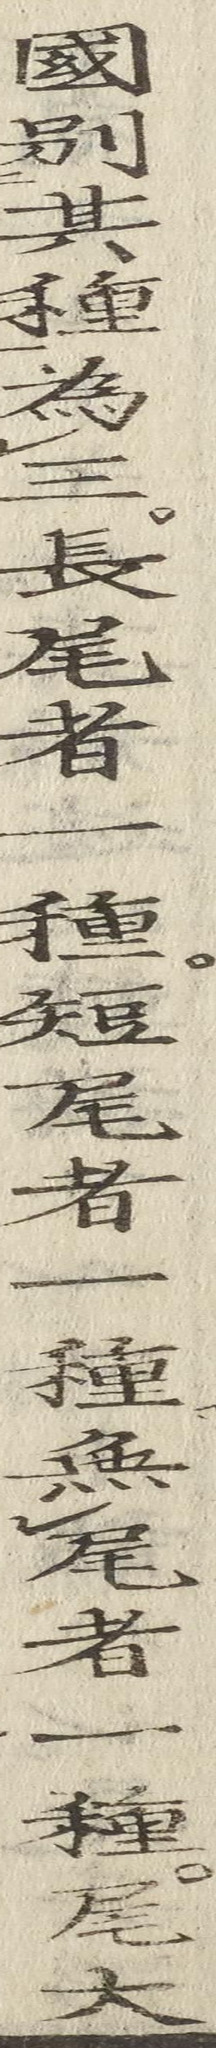国別ニ其種為三。長尾者一種。短尾者一種。無尾者一種。尾大
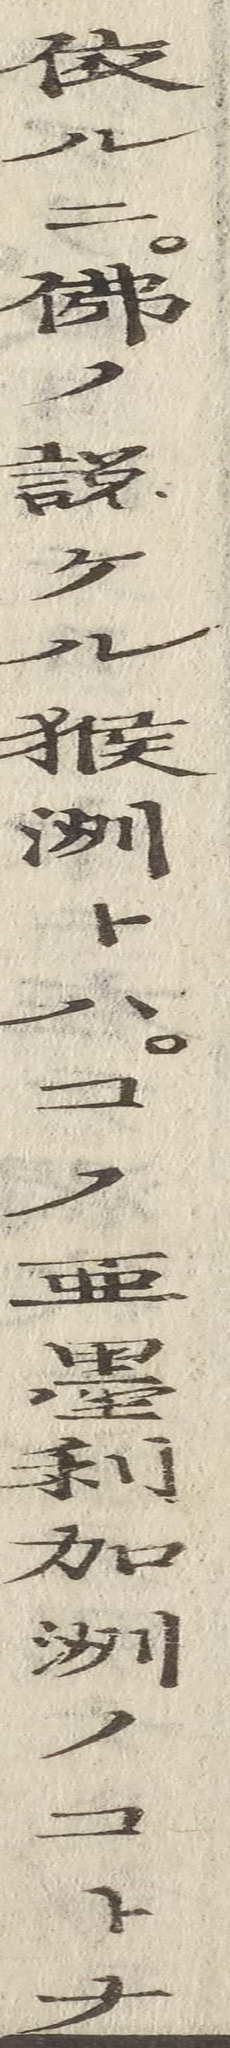依ルニ。仏ノ説ケル猴洲トハ。コノ亜墨利加洲ノコトナ
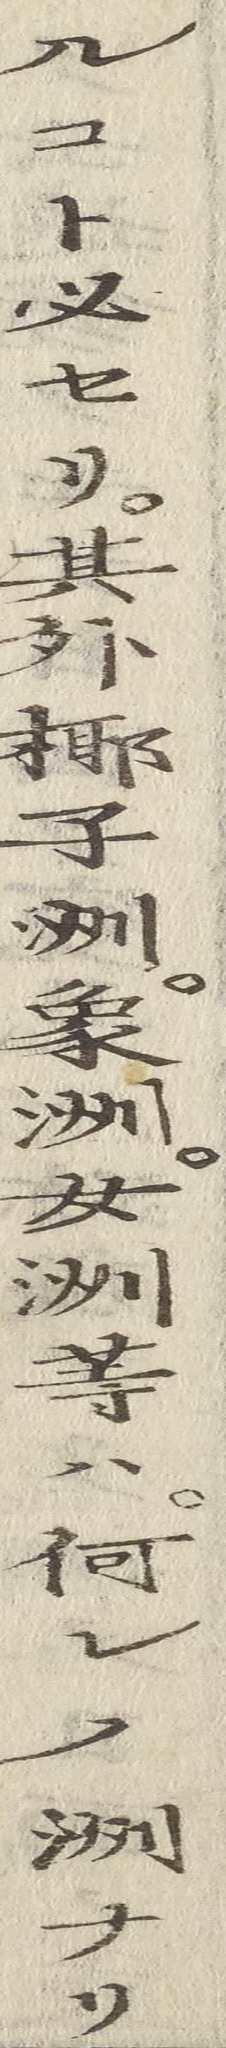ルコト必セリ。其外椰子洲。象洲。女洲等ハ。何レノ洲ナリ
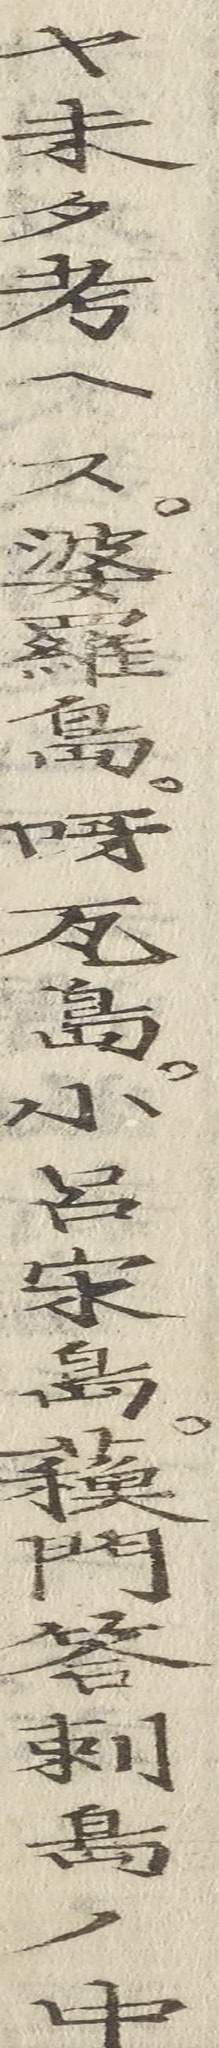ヤ未タ考ヘス。婆羅島。呀瓦島。小呂宋島。蘓門答刺島ノ中
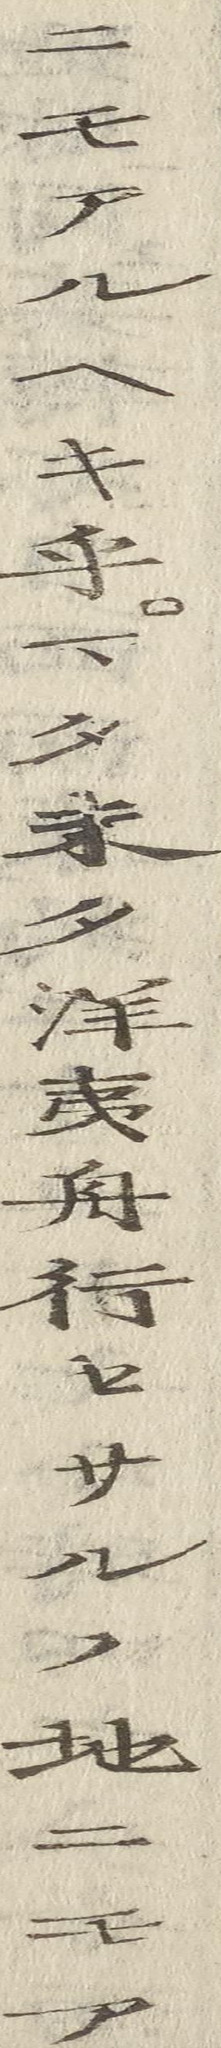ニモアルヘキ乎。マタ未タ洋夷舟行セサルノ地ニモア
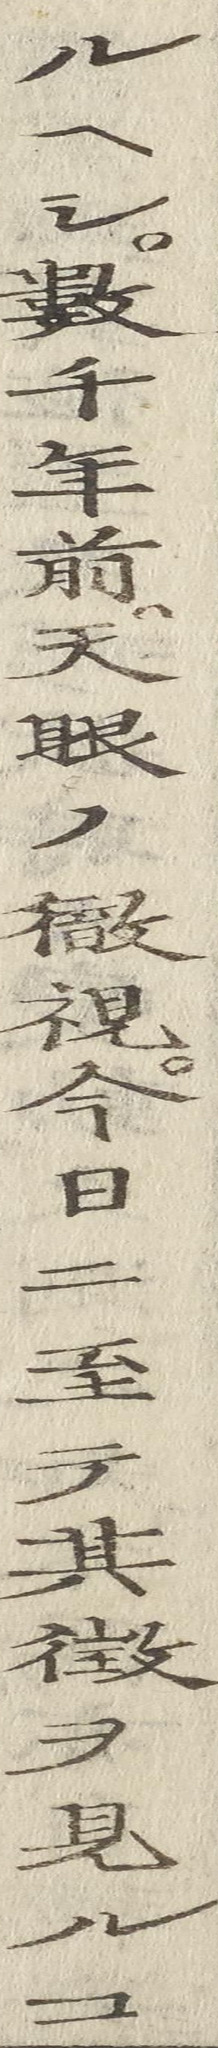ルヘシ。数千年前。天眼ノ徹視。今日ニ至テ其徴ヲ見ルコ
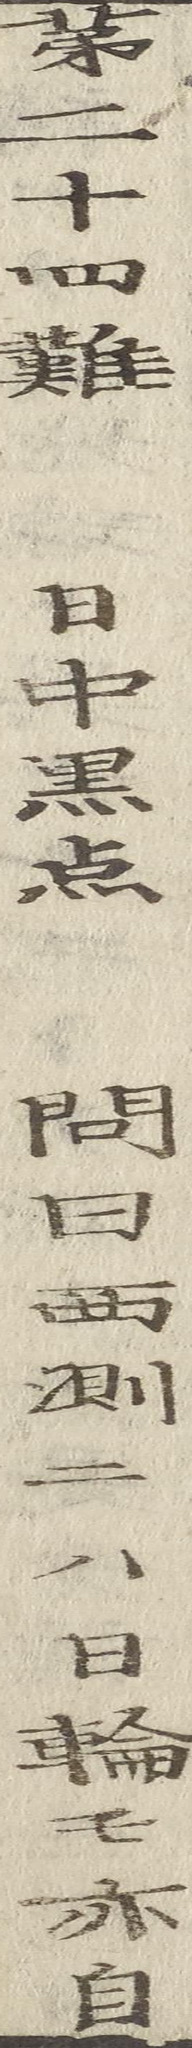第二十四難日中黒点問曰西測ニハ日輪モ亦自

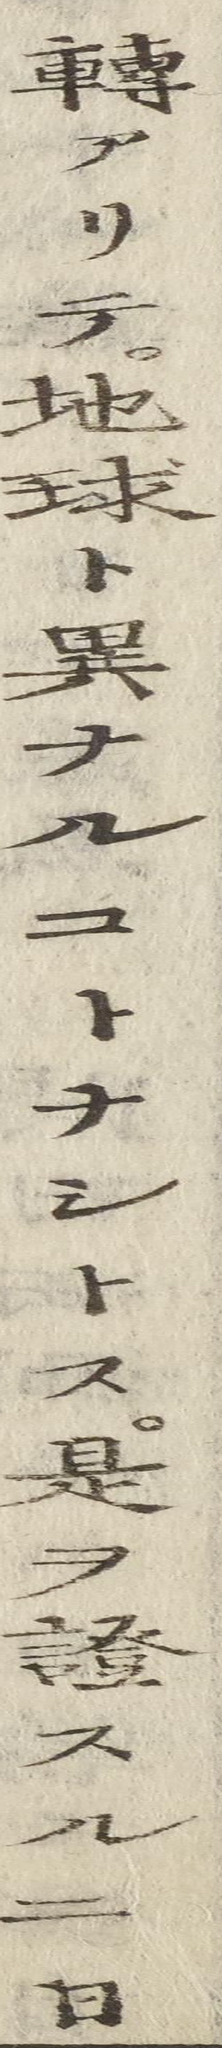転アリテ。地球ト異ナルコトナシトス。是ヲ証スルニ日
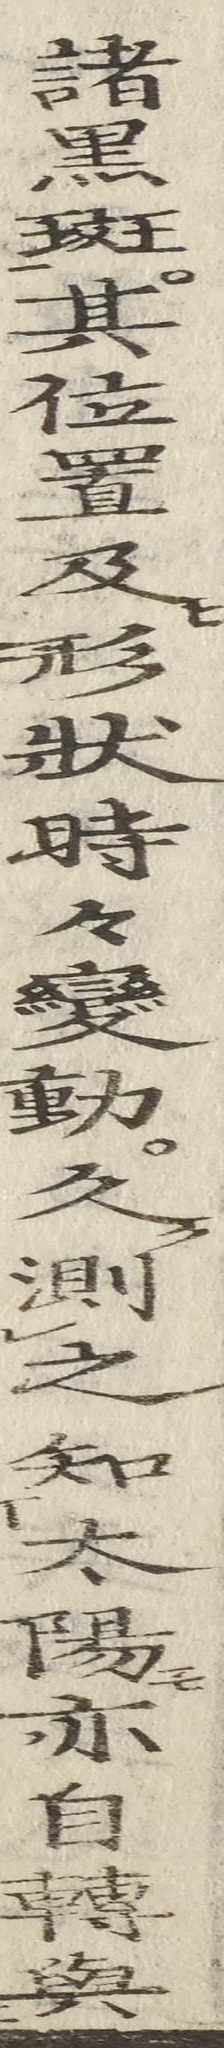諸黒斑。其位置及形状時々変動。久測之知太陽亦自転与ニ
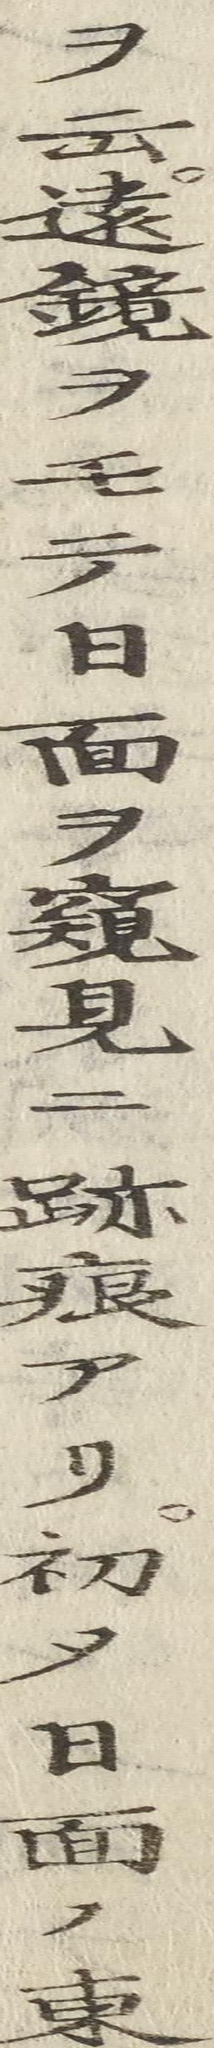ヲ云。遠鏡ヲモテ日面ヲ窺見ニ跡痕アリ。初メ日面ノ東
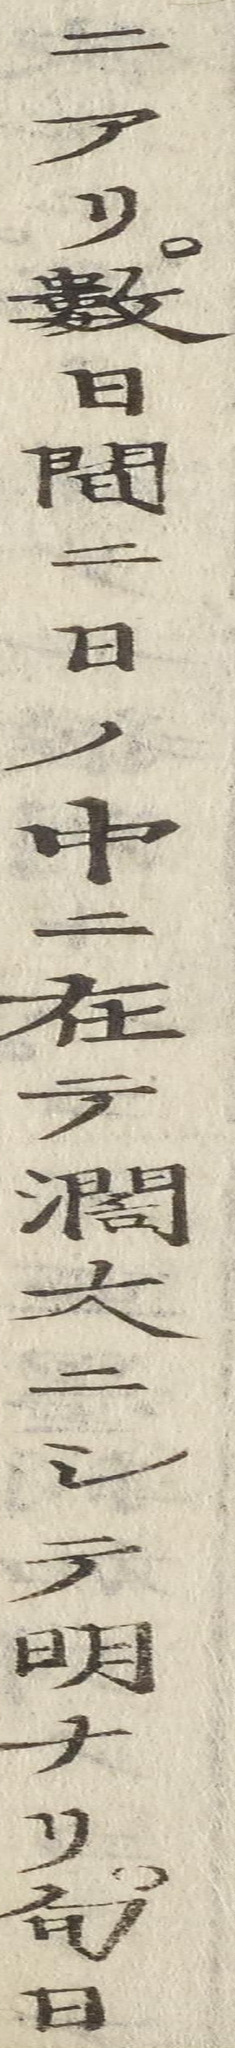ニアリ。数日間ニ日ノ中ニ在テ濶大ニシテ明ナリ。旬日
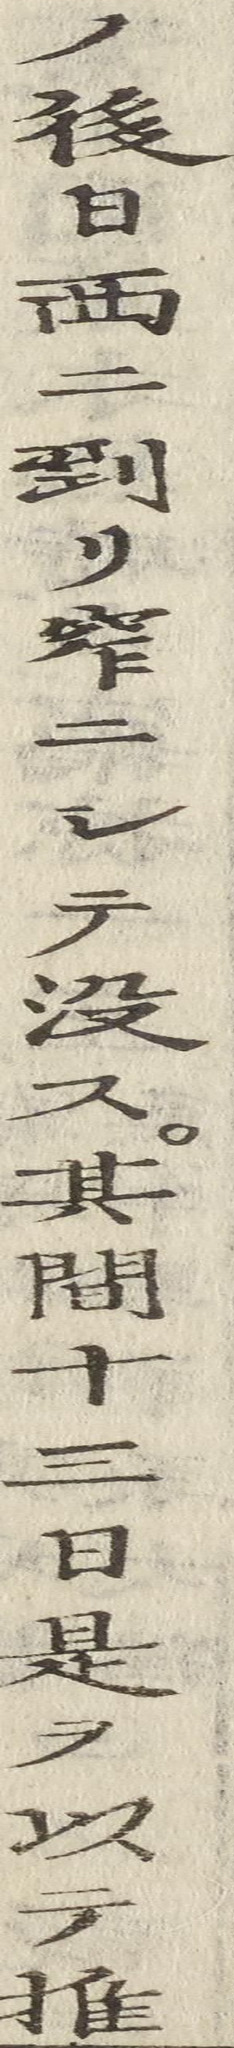ノ後日西ニ到リ窄ニシテ没ス。其間十三日是ヲ以テ推
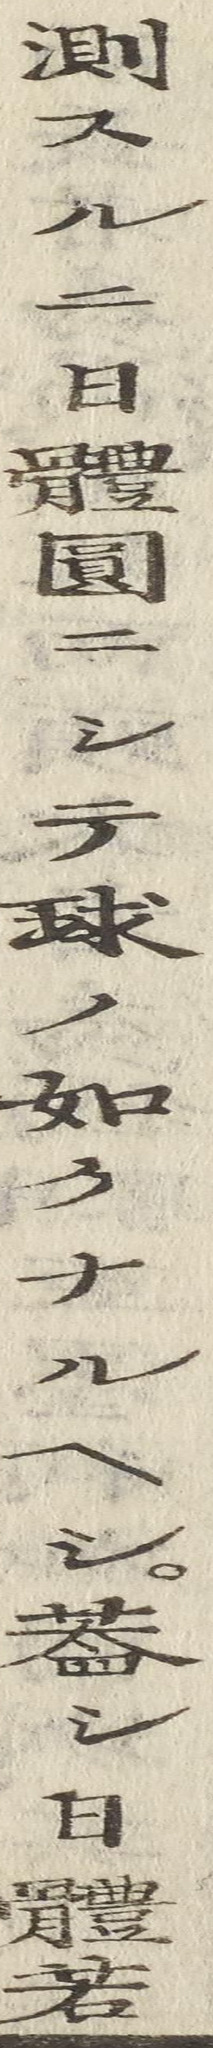測スルニ日体円ニシテ球ノ如クナルヘシ。葢シ日体若
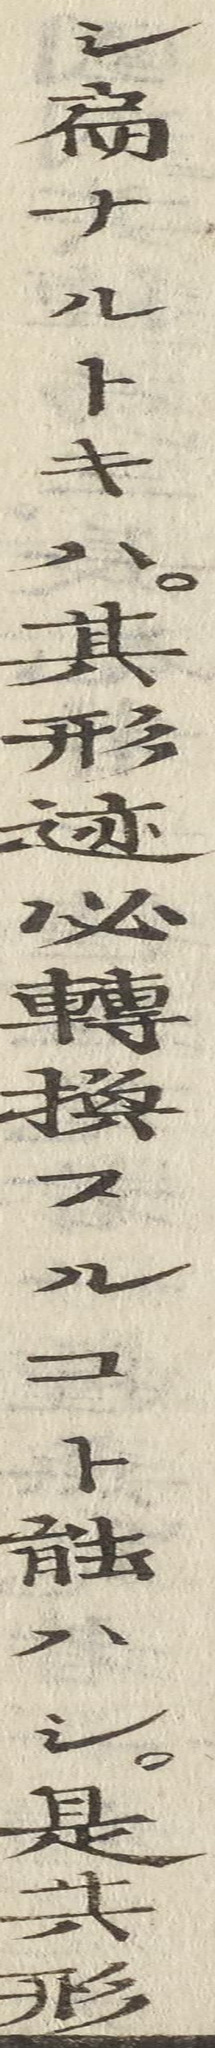シ扁ナルトキハ。其形迹必転換スルコト能ハシ。是其形
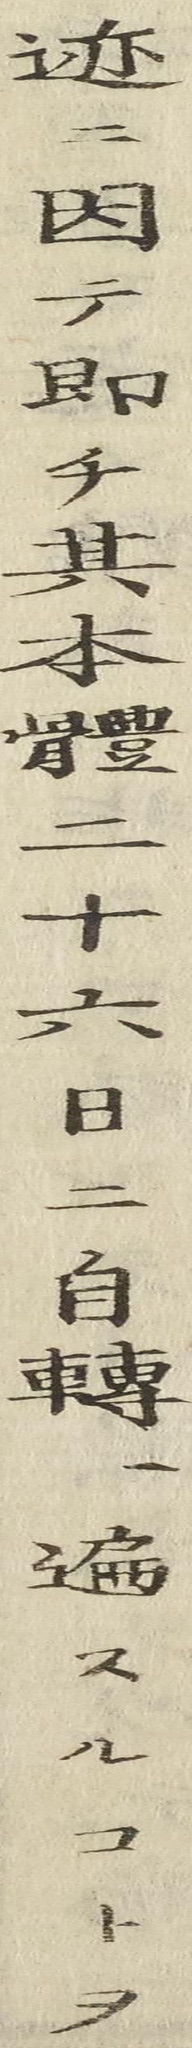迹ニ因テ即チ其本体二十六日ニ自転一遍スルコトヲ
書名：護法新論　二編　中
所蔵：東京大学地震研究所図書室 Earthquake Research Institute Library, The University of Tokyo, JAPAN
